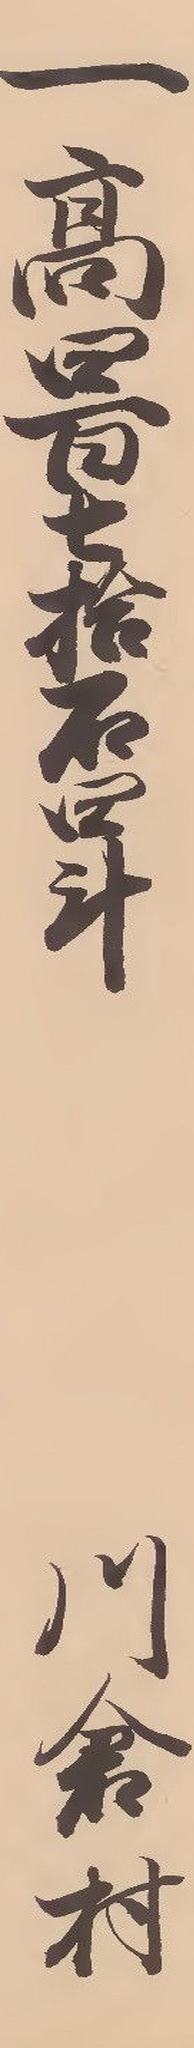一高四百七拾石四斗川倉村
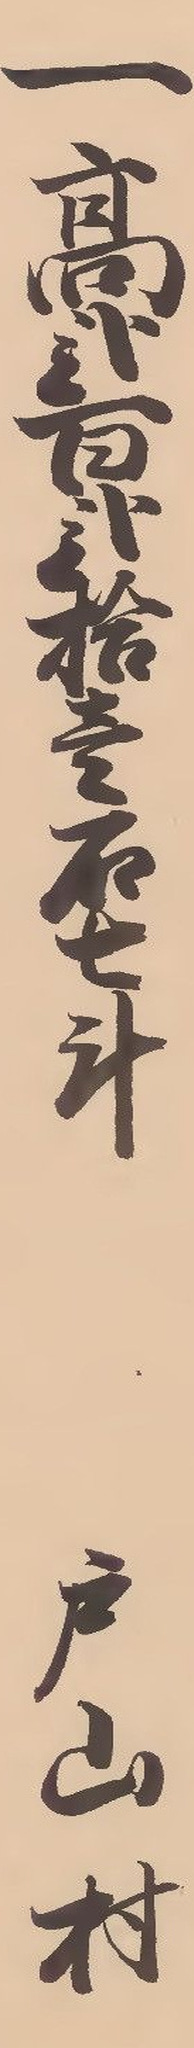一高弐百弐拾壱石七斗戸山村
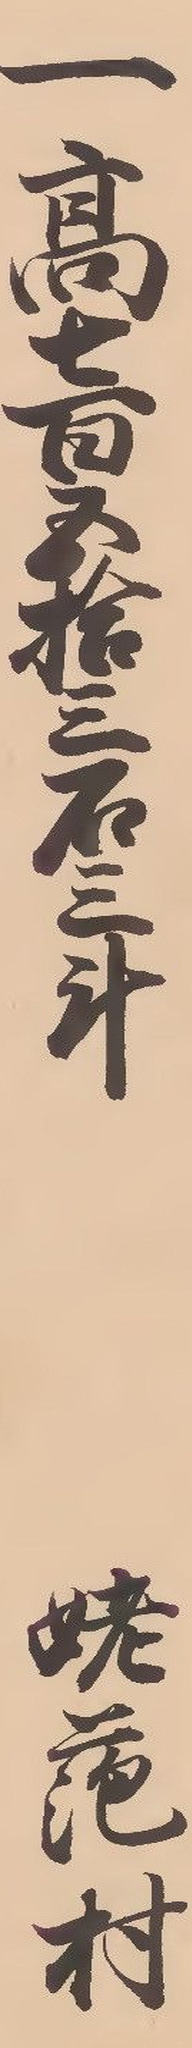一高七百五拾三石三斗姥萢村
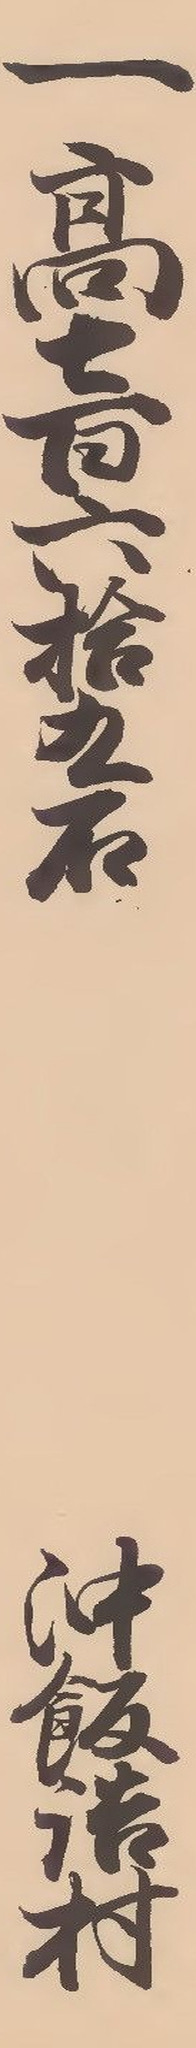一高七百六拾九石沖飯詰村
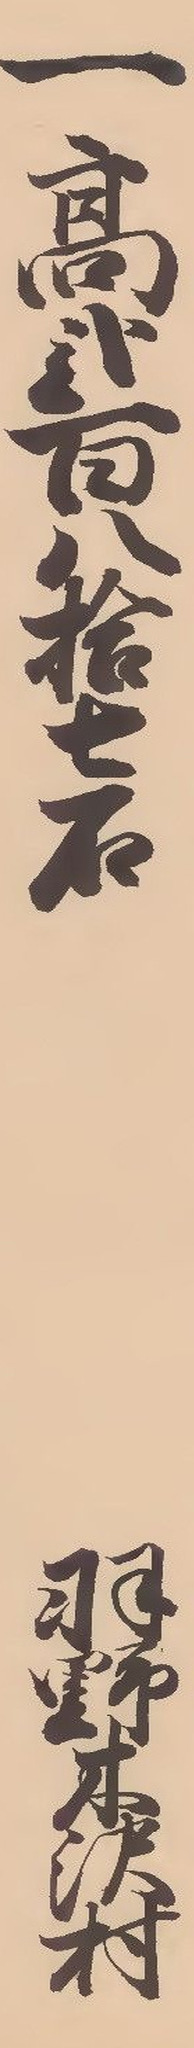一高弐百八拾七石羽野木沢村
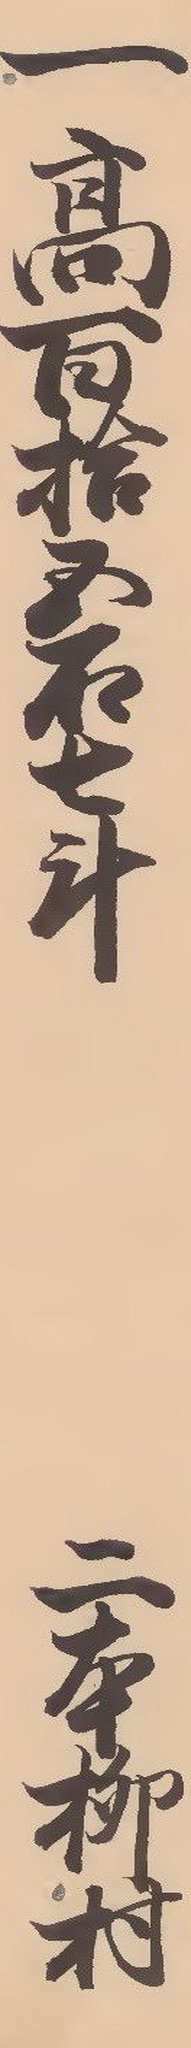一高百拾五石七斗二本柳村

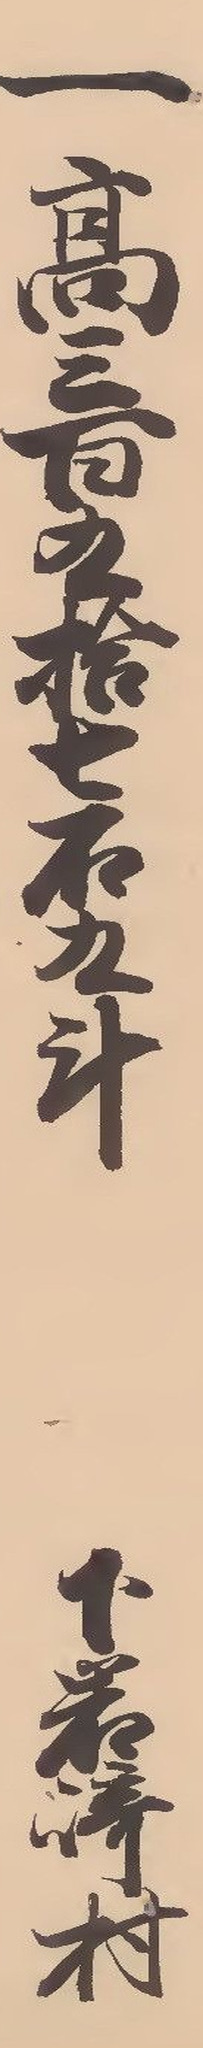一高三百九拾七石九斗下岩崎村
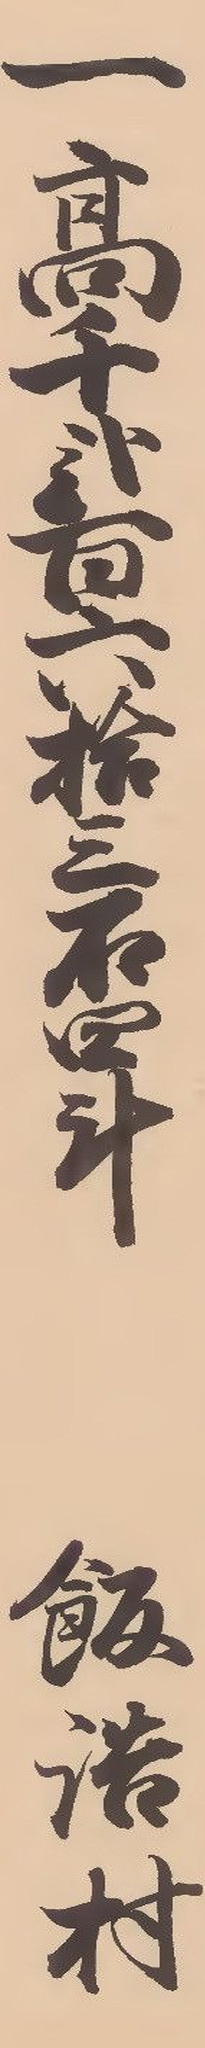一高千弐百六拾三石四斗飯誥村
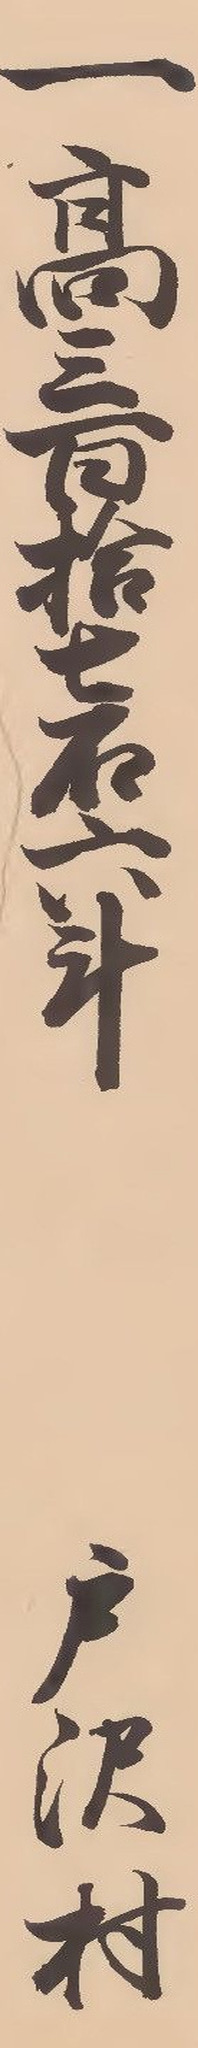一高三百拾七石六斗戸沢村
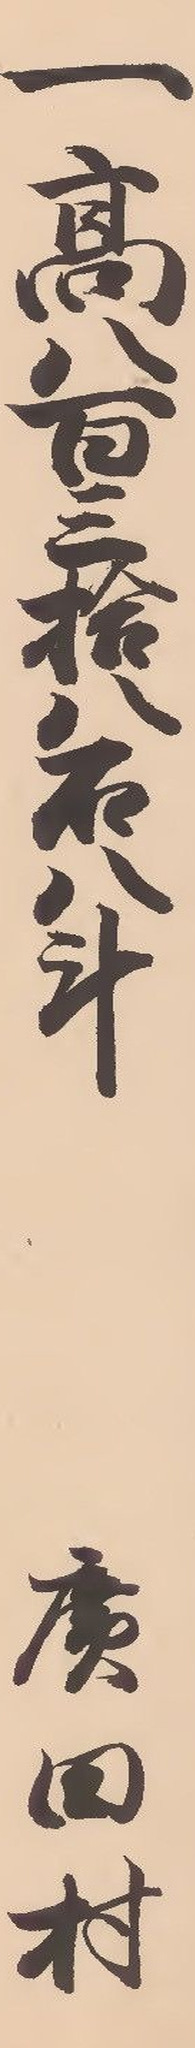一高八百三拾八石八斗広田村
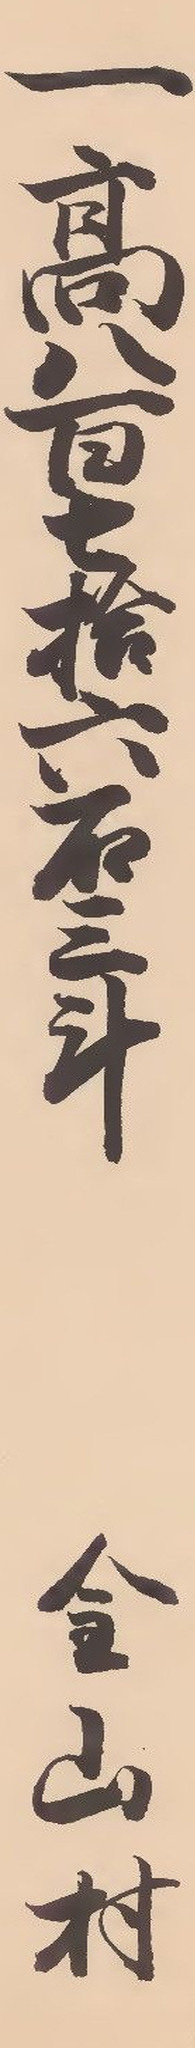一高八百七拾六石三斗金山村
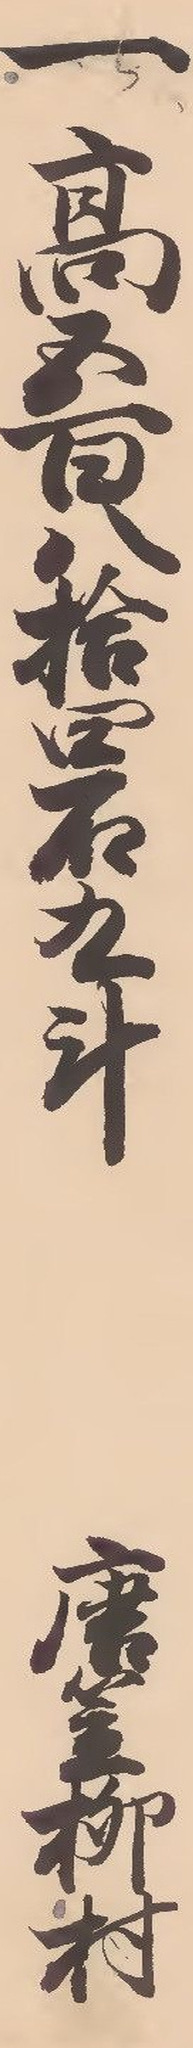一高五百八拾四石九斗唐笠柳村

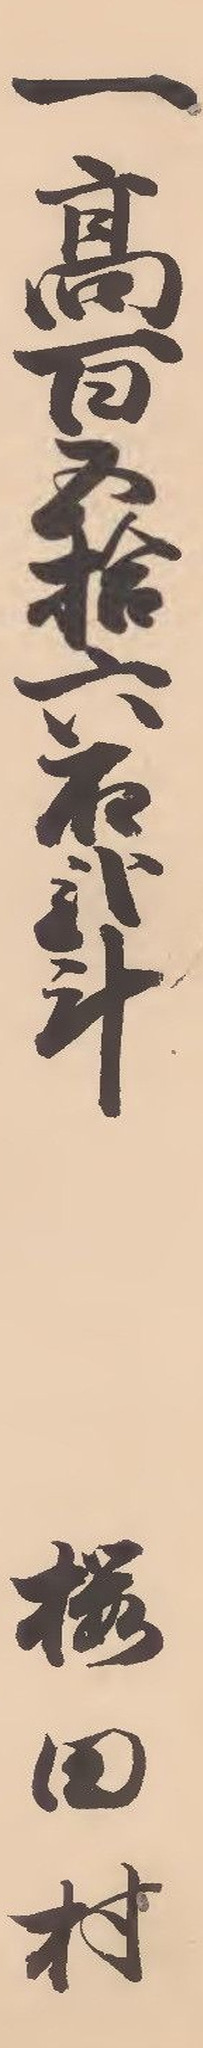一高百五拾六石弐斗桜田村
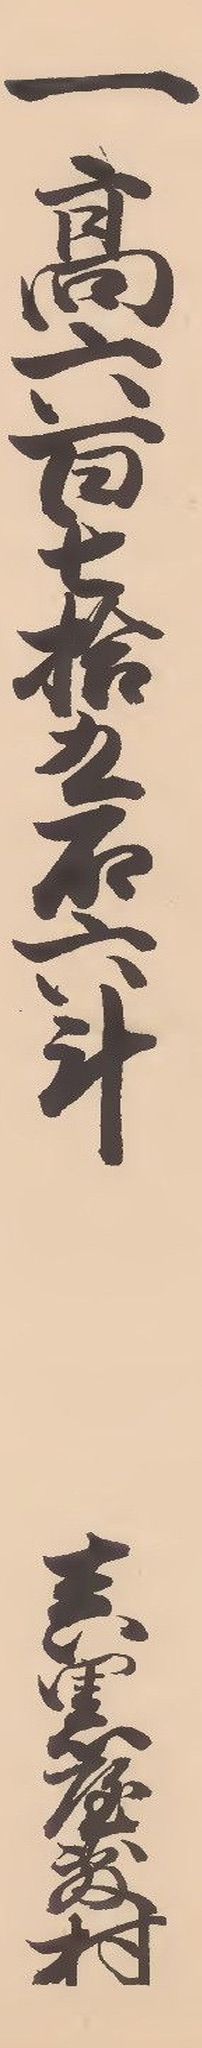一高六百七拾九石六斗真黒屋敷村
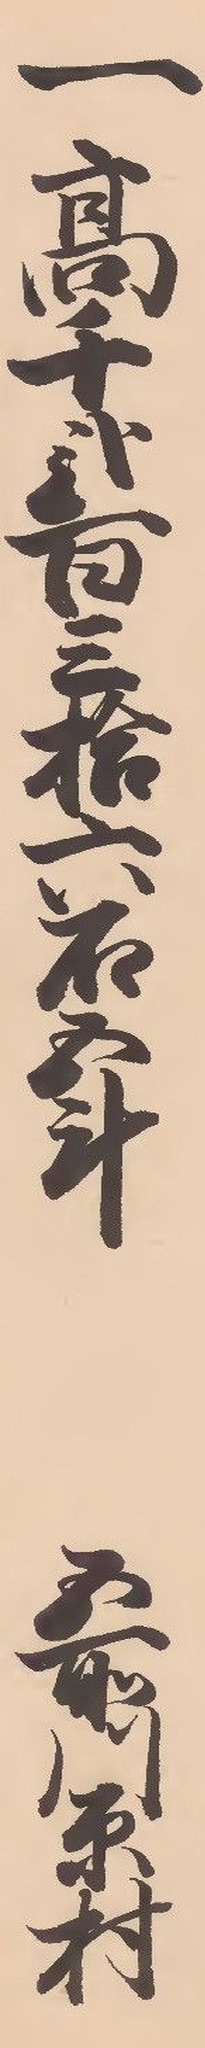一高千弐百三拾六石五斗五所川原村
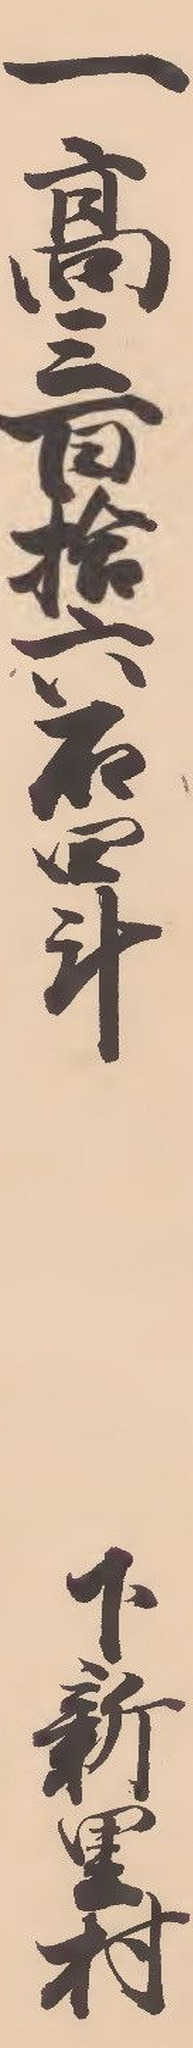一高三百拾六石四斗下新里村
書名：陸奥国郷帳　７
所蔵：国立公文書館 National Archives of Japan
